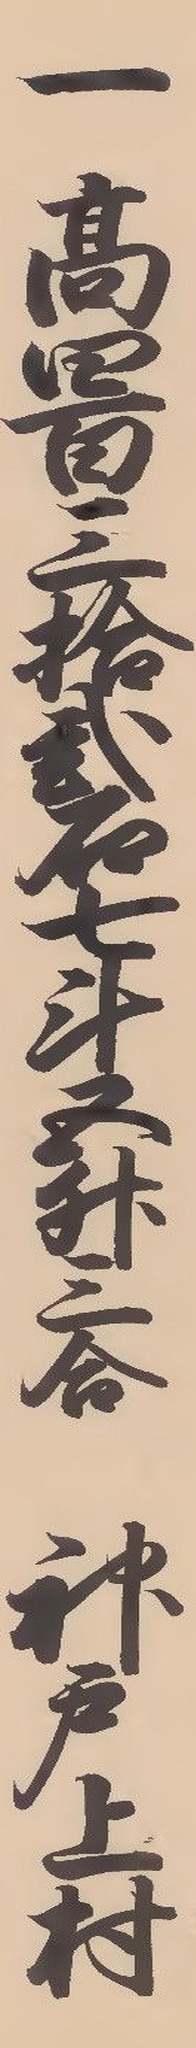一高四百三拾弐石七斗五升三合神戸上村
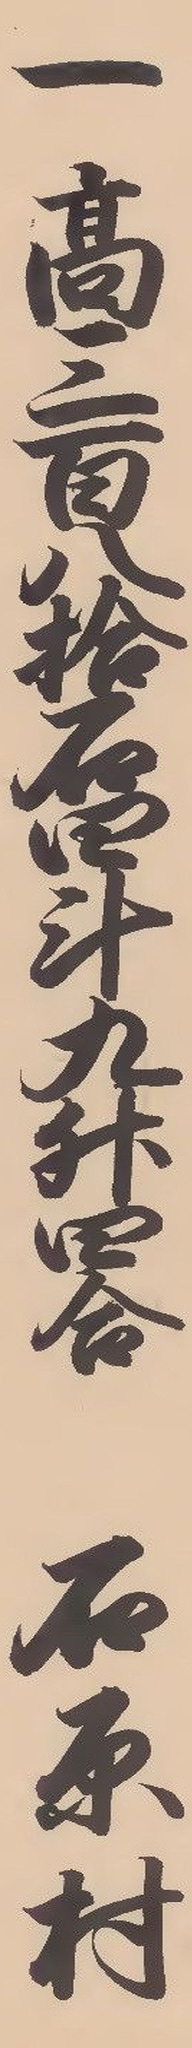一高三百八拾石四斗九升四合石原村
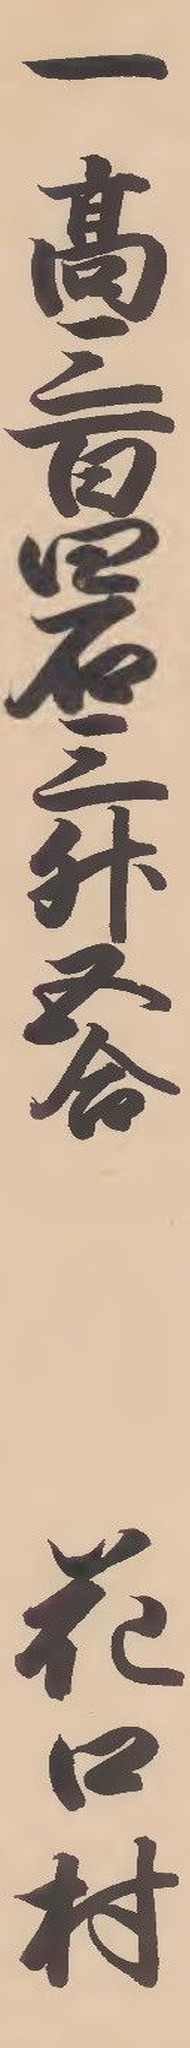一高三百四石三升五合花口村

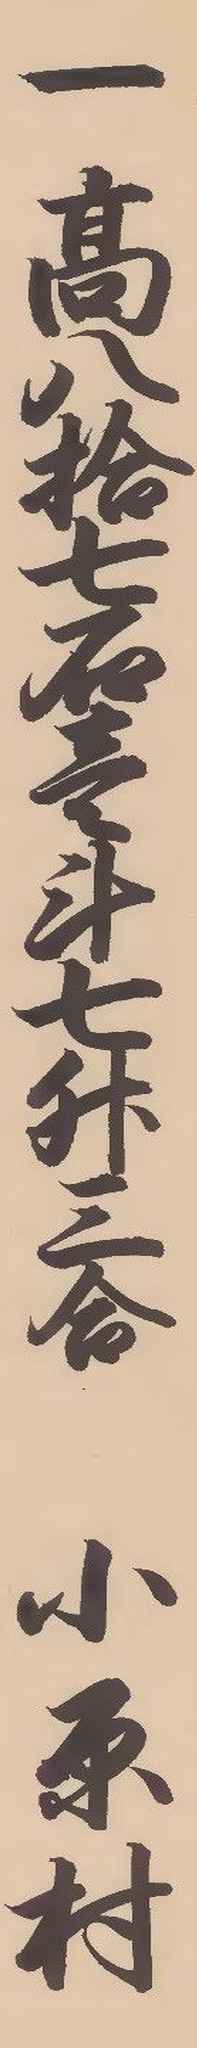一高八拾七石壱斗七升三合小原村
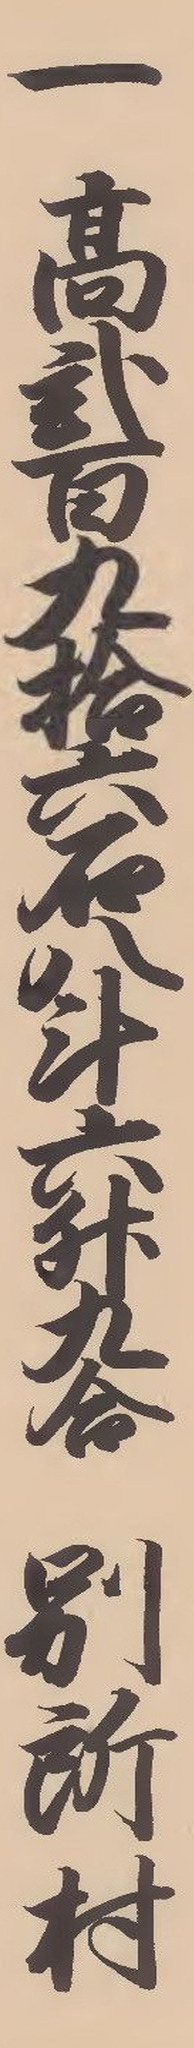一高弐百九拾六石八斗六升九合別所村
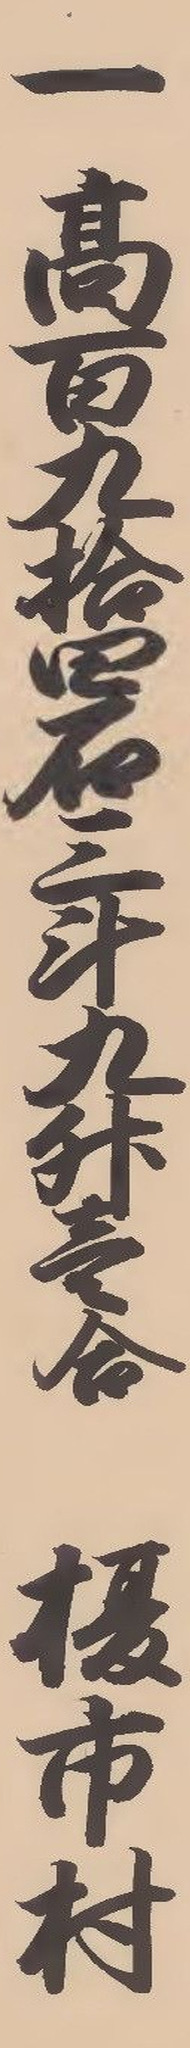一高百九拾四石三斗九升壱合榎市村
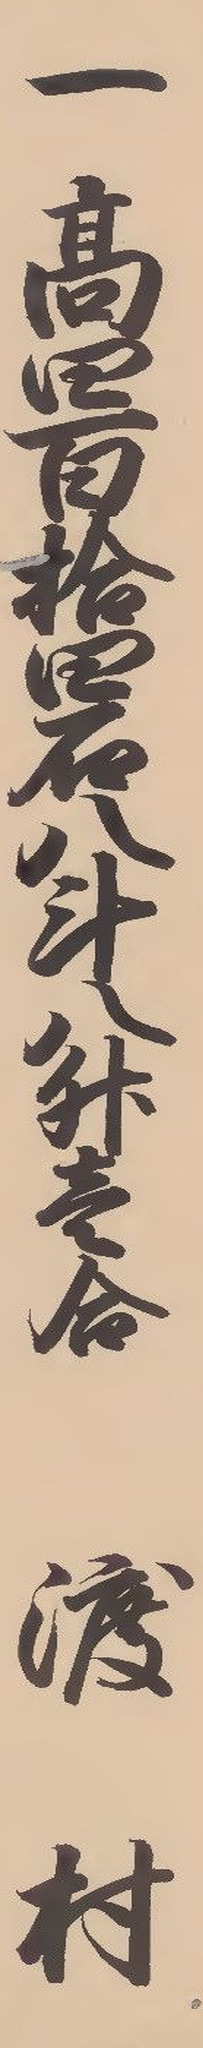一高四百拾四石八斗八升壱合渡村
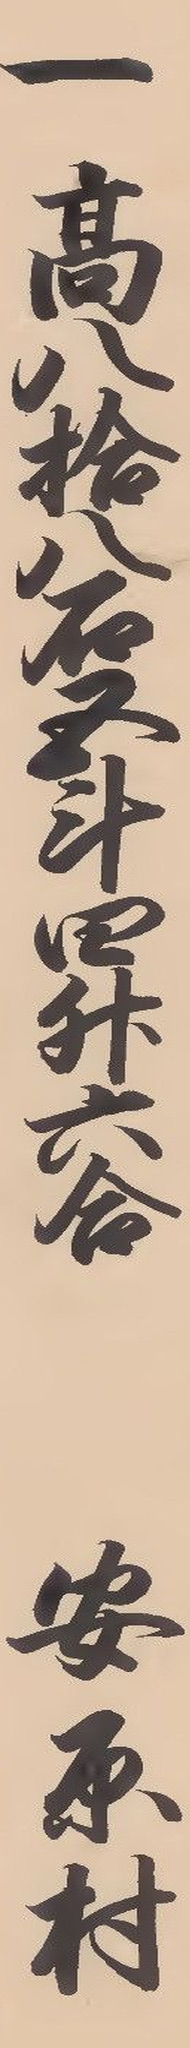一高八拾八石五斗四升六合安原村
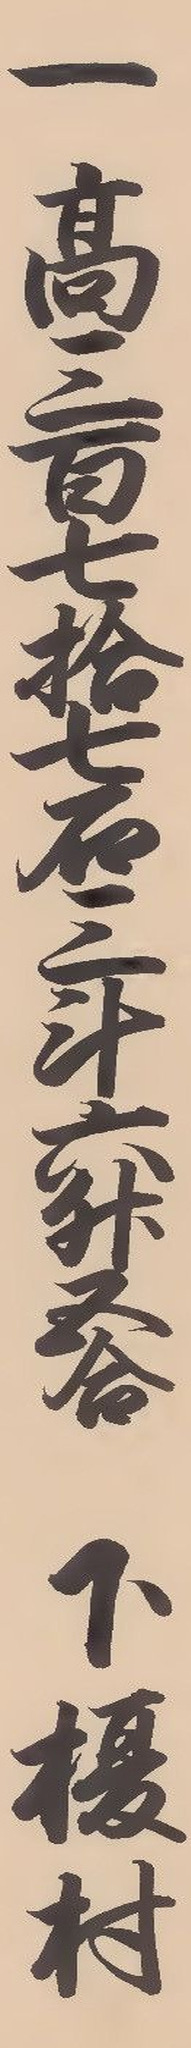一高三百七拾七石三斗六升五合下榎村
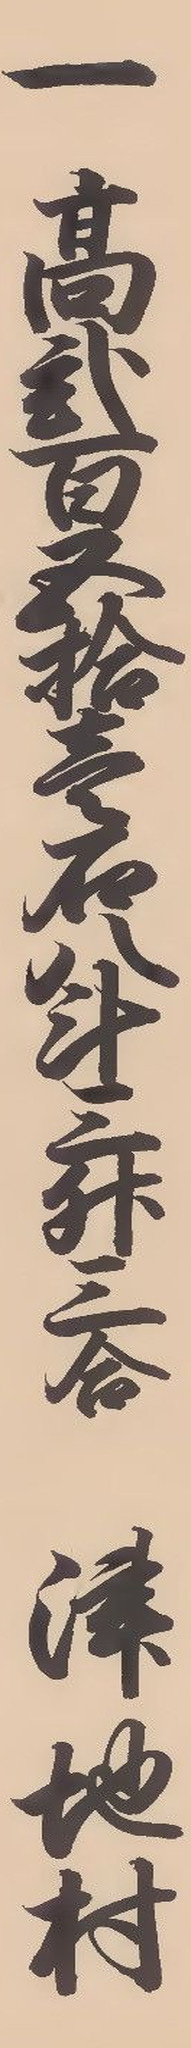一高弐百五拾壱石八斗三升三合津地村
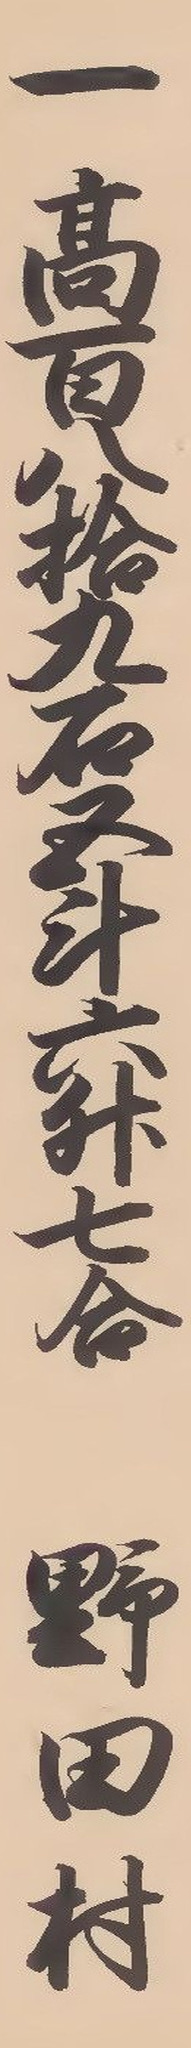一高百八拾九石五斗六升七合野田村

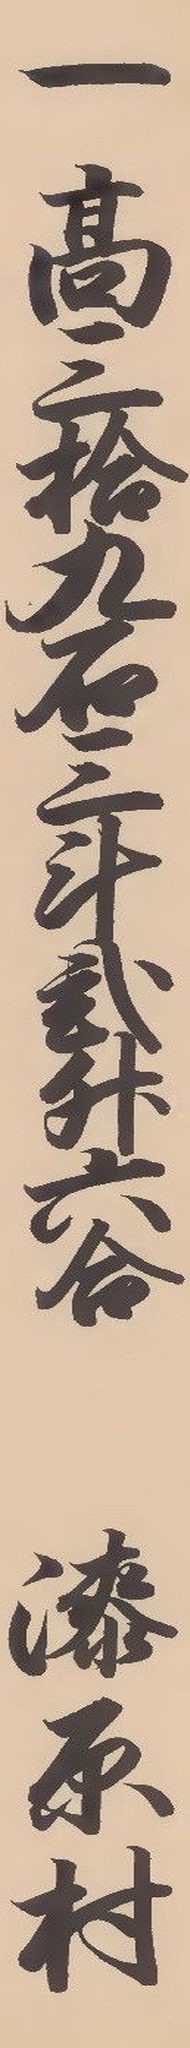一高三拾九石三斗弐升六合漆原村
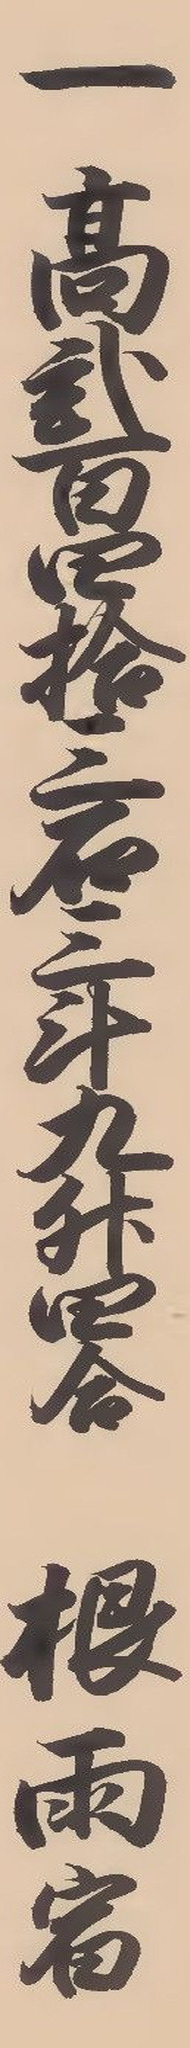一高弐百四拾三石三斗九升四合根雨宿
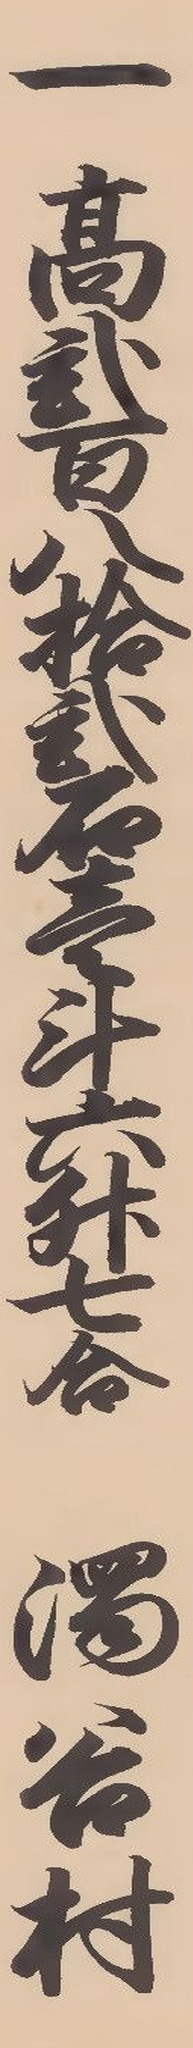一高弐百八拾弐石壱斗六升七合濁谷村
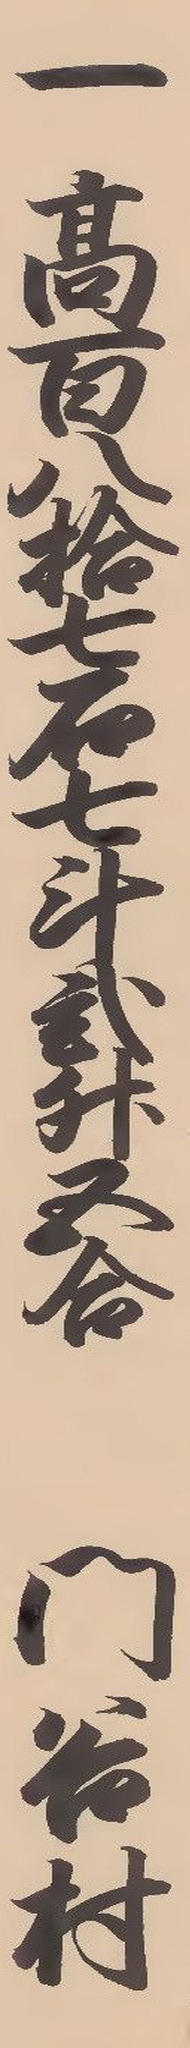一高百八拾七石七斗弐升五合門谷村
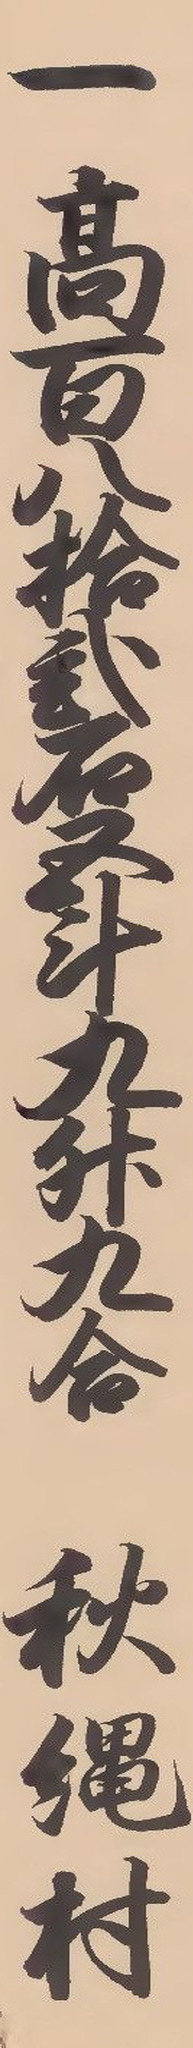一高百八拾弐石五斗九升九合秋縄村
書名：伯耆国郷帳
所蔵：国立公文書館 National Archives of Japan
